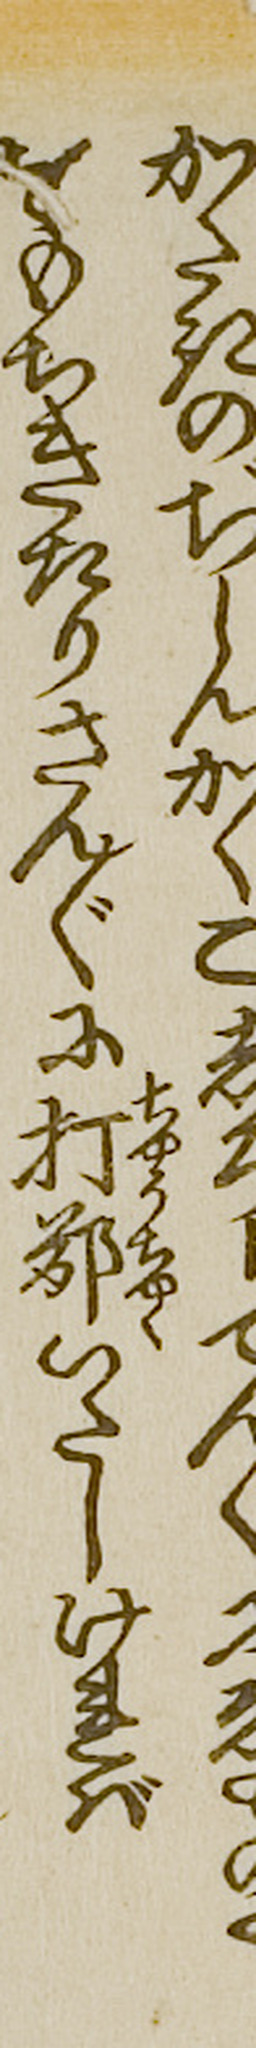をもちきたりさん〴〵に打擲いたしければ
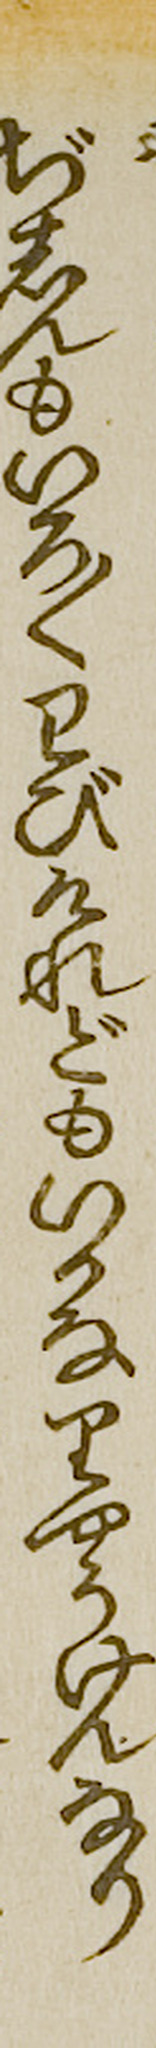ぢしんもいろ＼わびけれどもいかなりやうけんなり
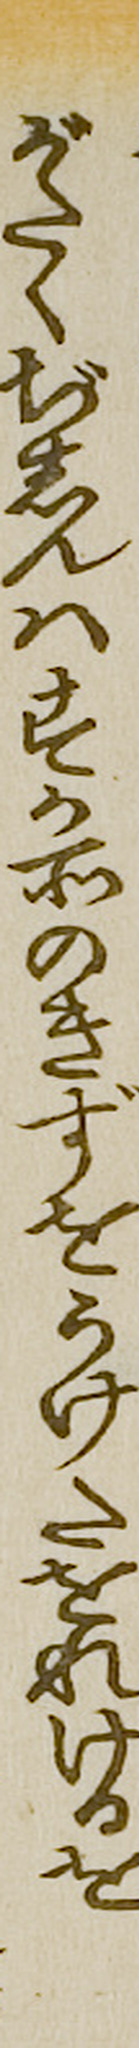がたくぢしんはすか所のきずをうけたをれけるを
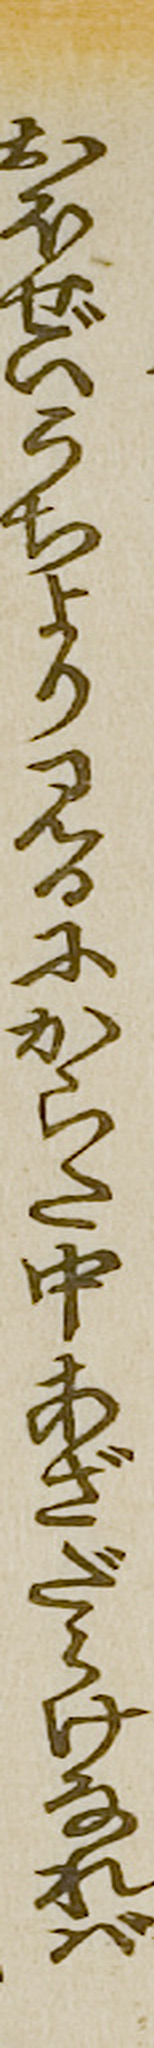おほぜいこちより見るにからた中あざだらけなれば
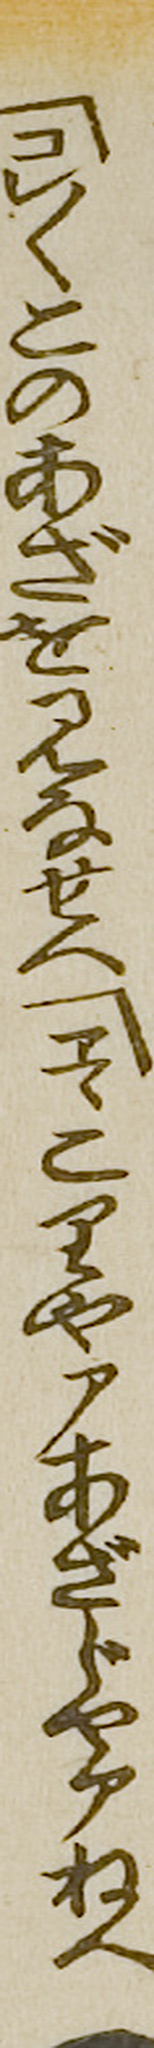「コレ＼このあざを見なせへ「ヱヽこりやアあざじやアねへ
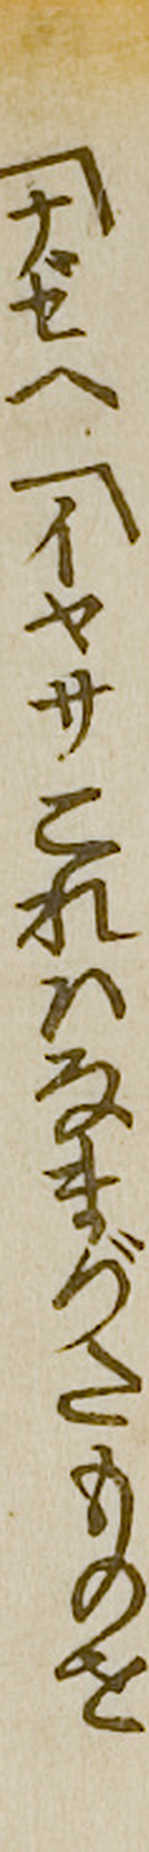「ナゼヘ「イヤサこれはなまづたものを
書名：即席鯰はなし
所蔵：東京大学総合図書館 General Library in the University of Tokyo, JAPAN
